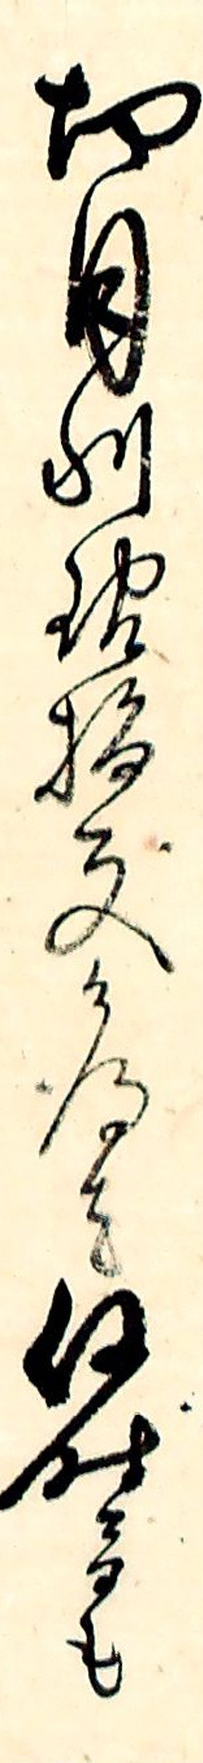切月利銀指支候得は何時にても
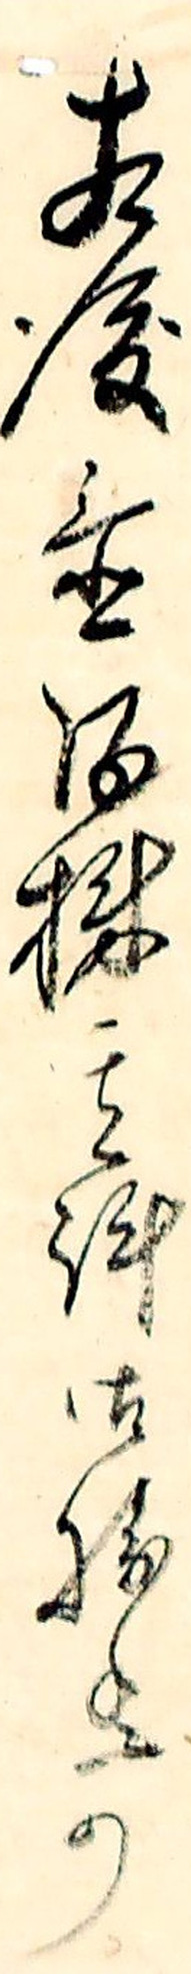相渡置酒株其許御勝手に可
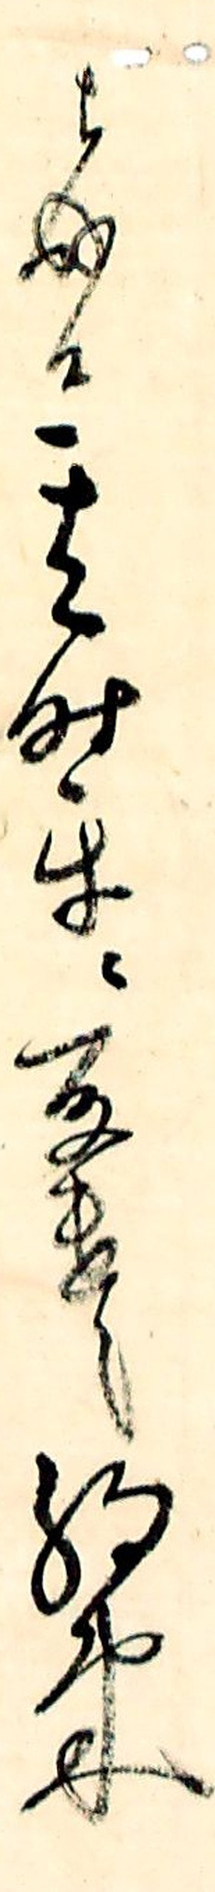被成候其時互に取遣之約束
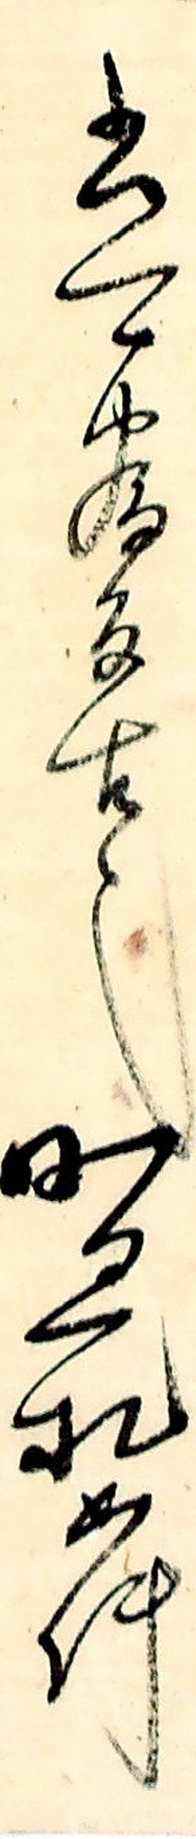書可為反古也仍て一札如件
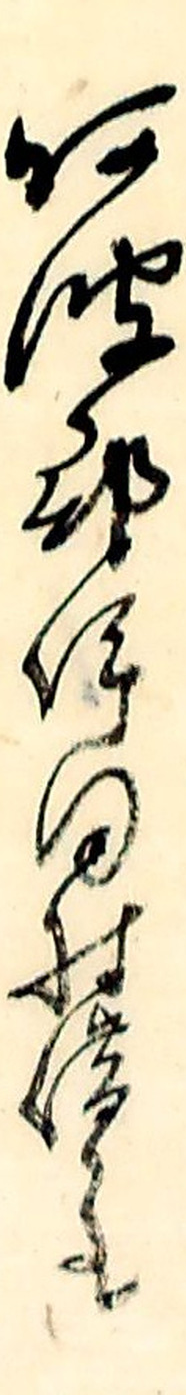阿波郡伊月村借り主
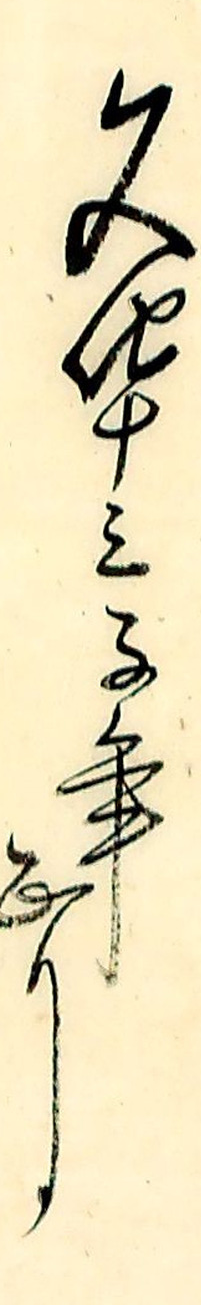文化十三子年
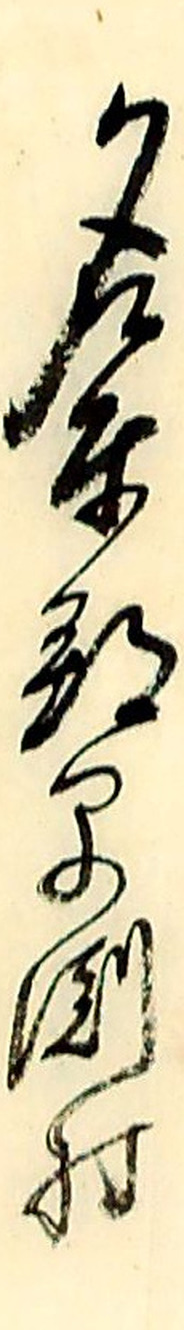名東郡早淵村
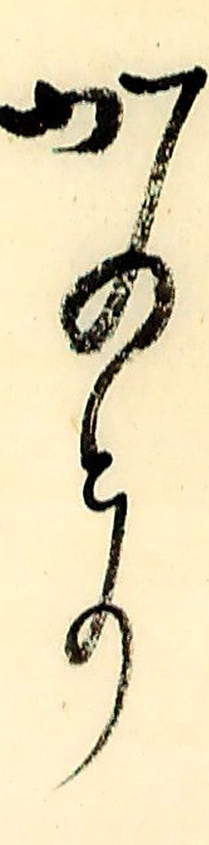かのとの
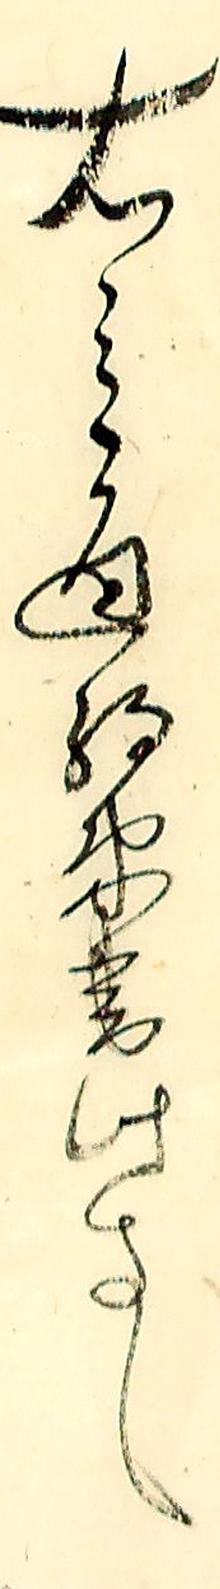右之通約束書此方へ
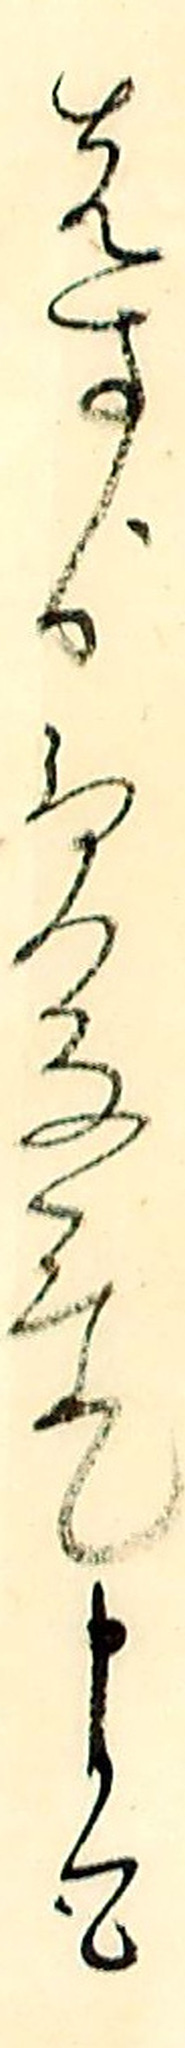先方ゟ受取置候申上候

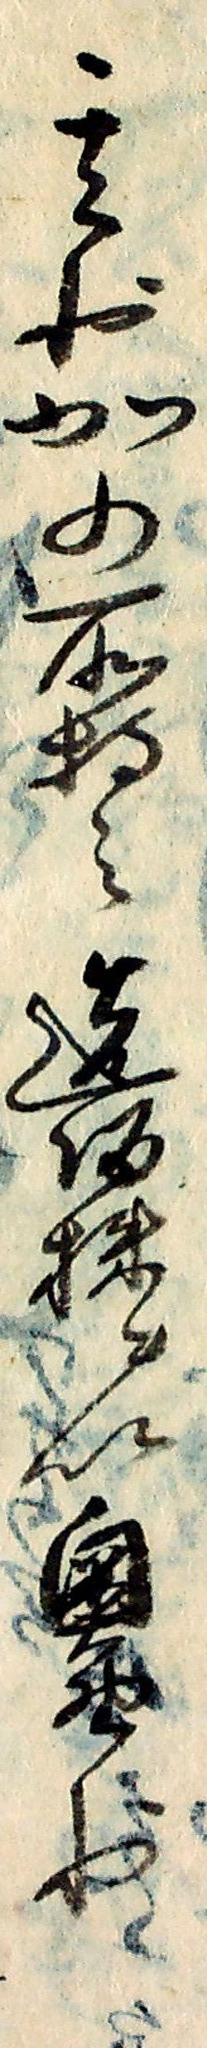其村かの所持之造酒株を以奥野村
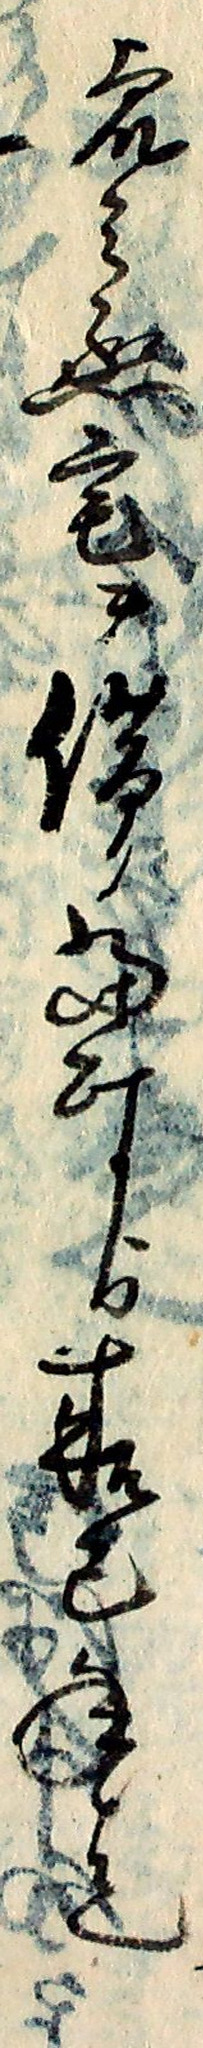虎之丞宅を借り当正月ゟ来る巳年迄
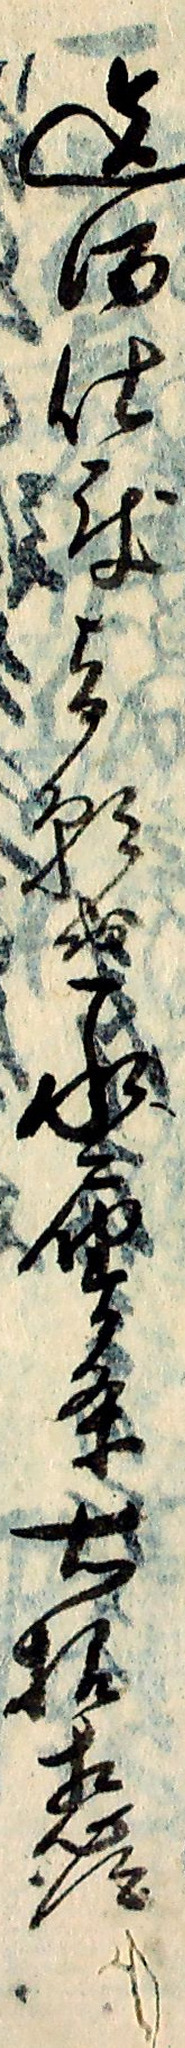造酒仕度旨願出承届候条右様相心得
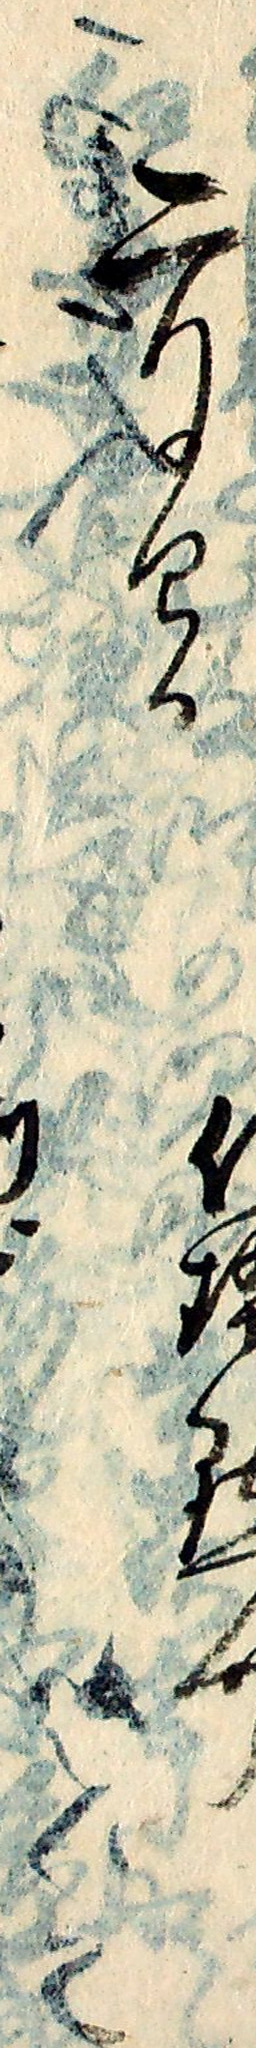二月四日
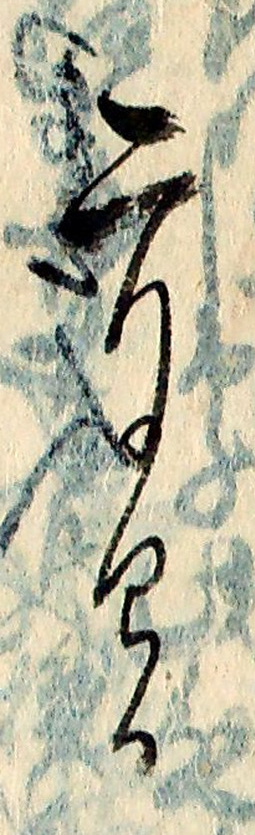二月四日
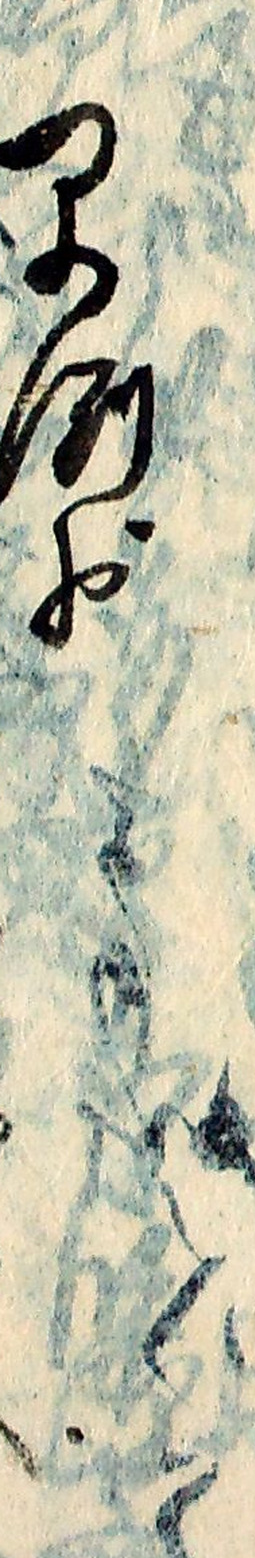早淵村
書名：諸御願書控(後藤氏壱番）
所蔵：鳴門教育大学 Naruto University of Education
